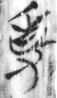事
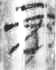不
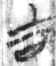吉
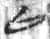㠯（以）
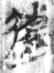遠
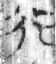行
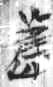舊（久）
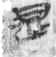是
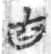古
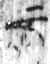不
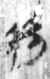利（利）
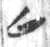㠯（以）
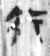行
